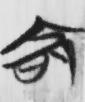命
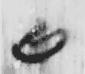㠯（以）
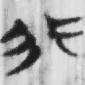行
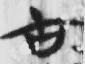古
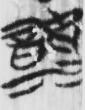○（遣）
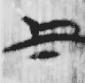上
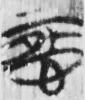恆
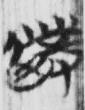○（僕）
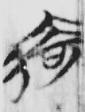徛
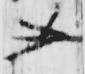之
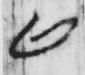㠯（以）
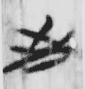至（致）
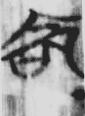命
